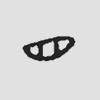四
